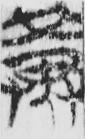畢
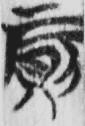厠
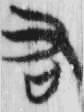右
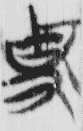史
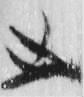之
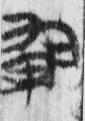軍
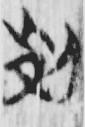死
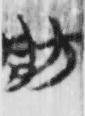○（病）
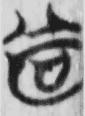甚
